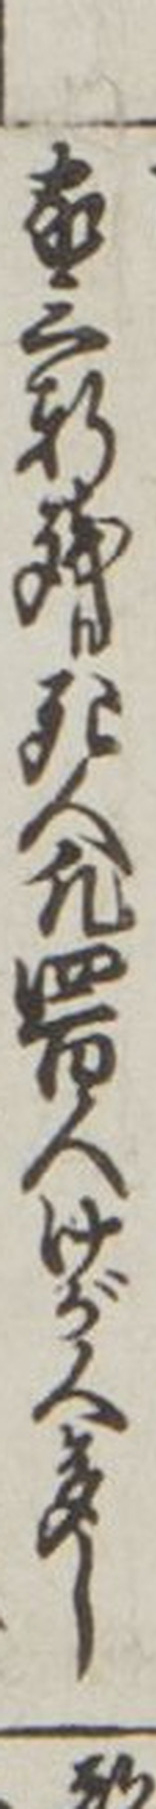家三軒残る死人凡四百人けが人多し
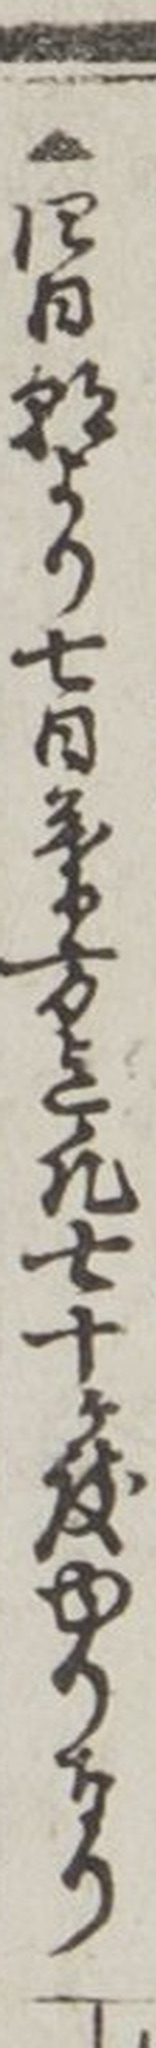▲四日朝より七日暮方迄凡七十ヶ度ゆりなり
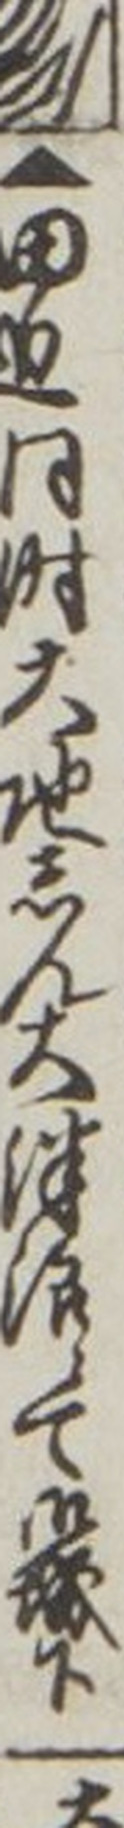▲田辺同時大地しん大津浪にて御城下
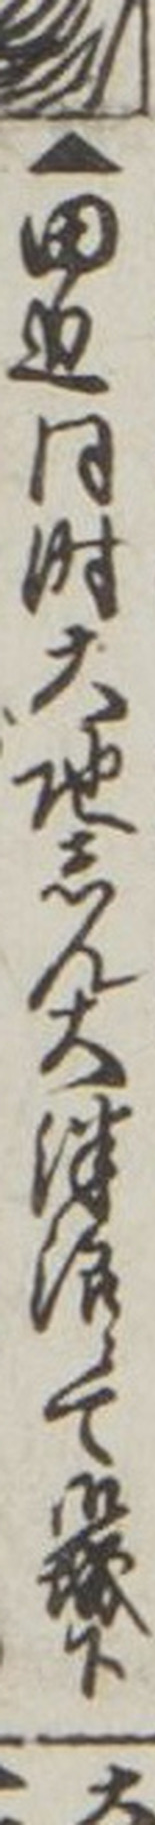▲田辺同時大地しん大津浪にて御城下
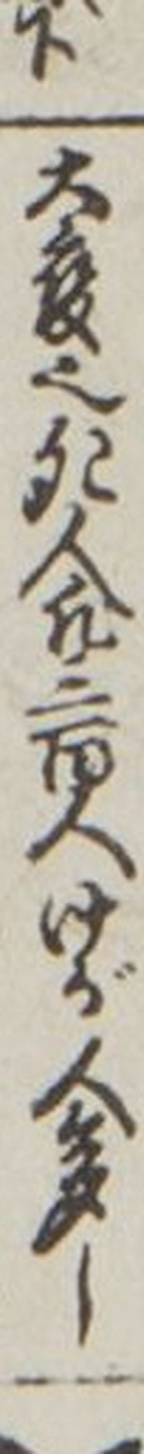大変也死人凡二百人けが人多し
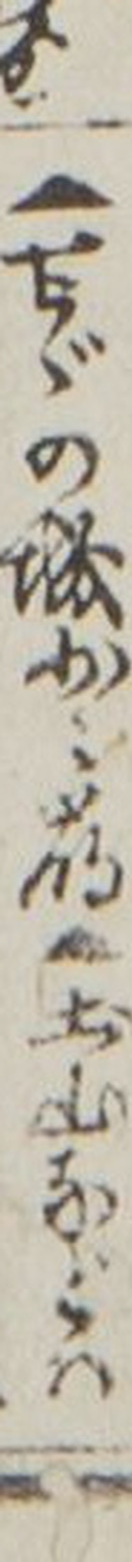ゼゞの城少々崩▲土山などは
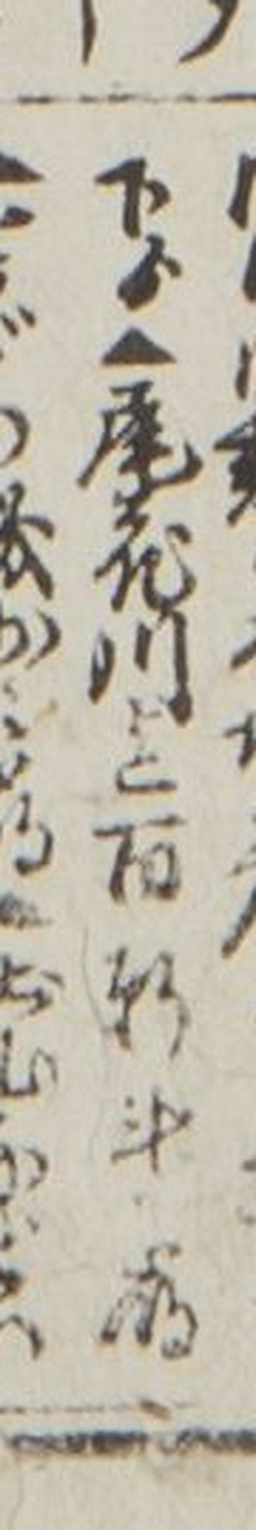ゼゞの城少々崩▲土山などは
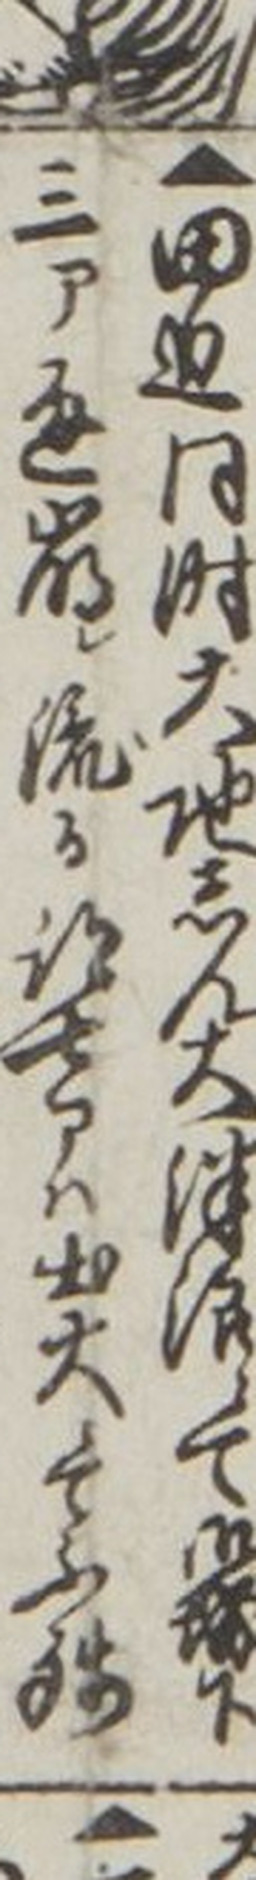三部通崩れ流る跡七部は出火にて不残
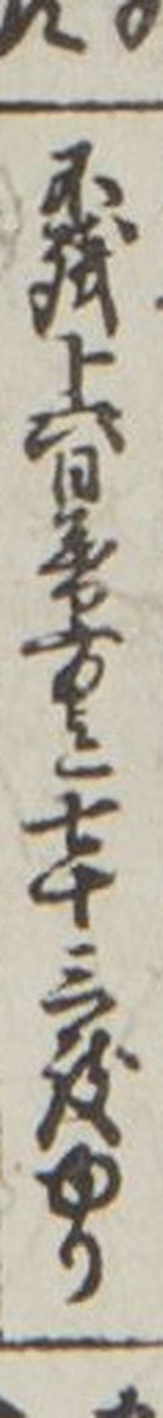不残十六日暮方迄七十三度ゆり
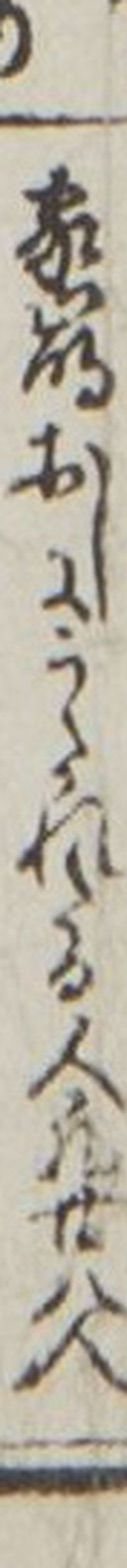家崩おしにうたれたる人凡廿八人
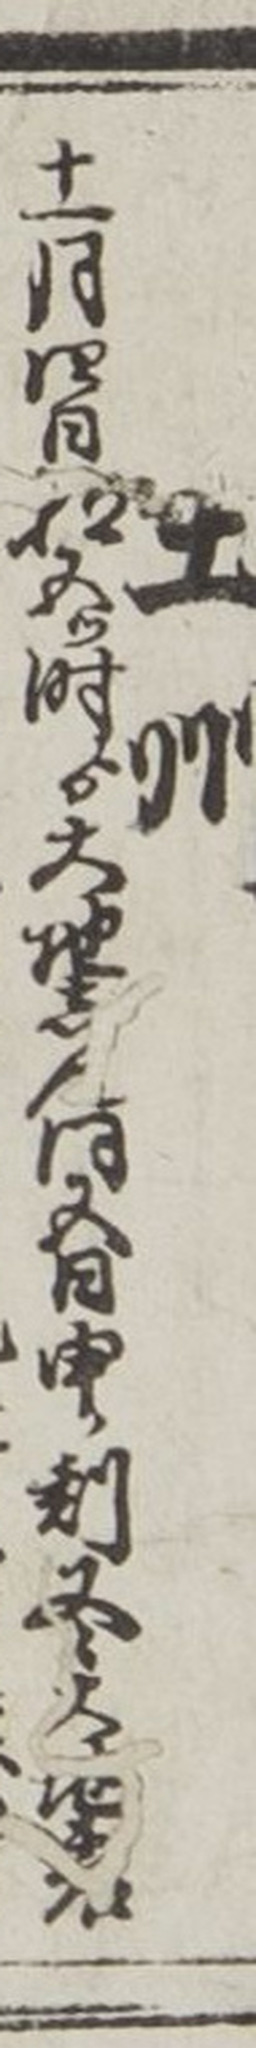十一月四日朝五ツ時より大地しん同五日申ノ刻又々大地震
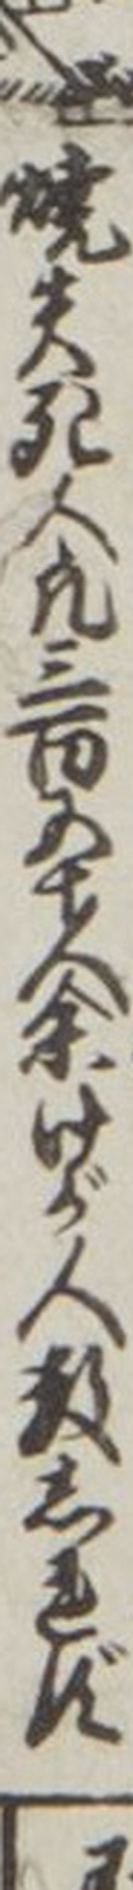焼失死人凡三百五十人余けが人数しれず
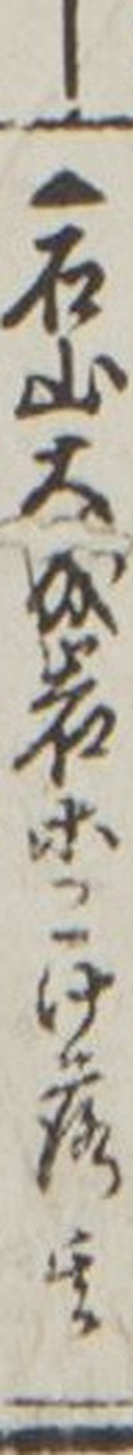▲石山大成岩等こけ落其
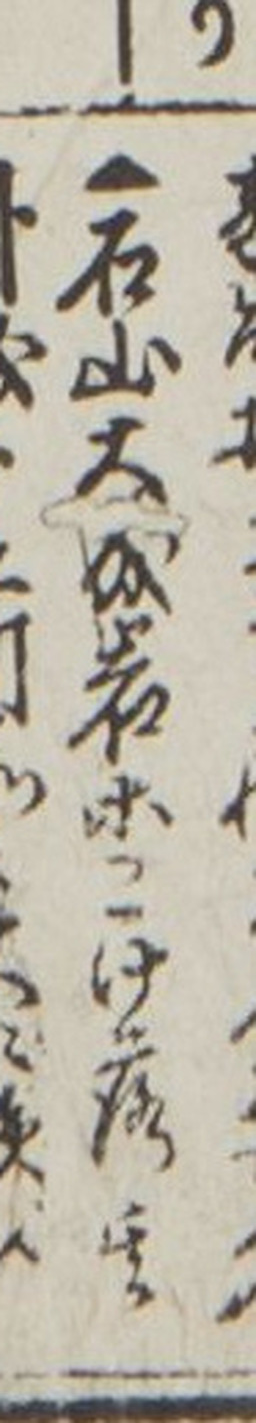▲石山大成岩等こけ落其
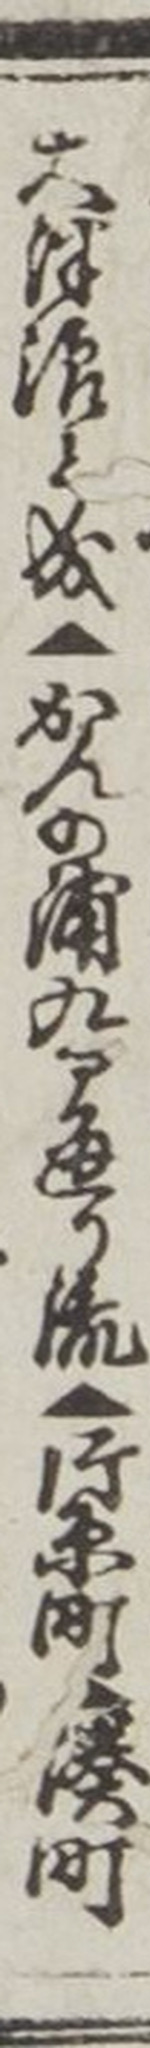大津浪と成▲かんの浦九部通り流▲片原町▲湊町
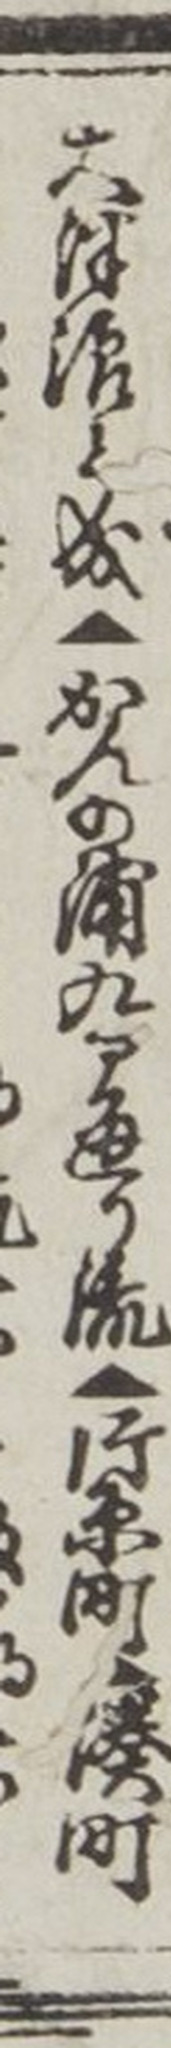大津浪と成▲かんの浦九部通り流▲片原町▲湊町
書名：嘉永七年寅十一月諸国大地震大津波并出火
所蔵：あいおいニッセイ同和損保株式会社
